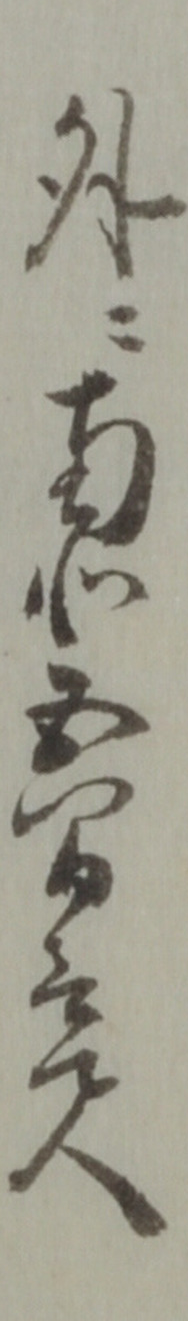外ニ南北五間壱尺
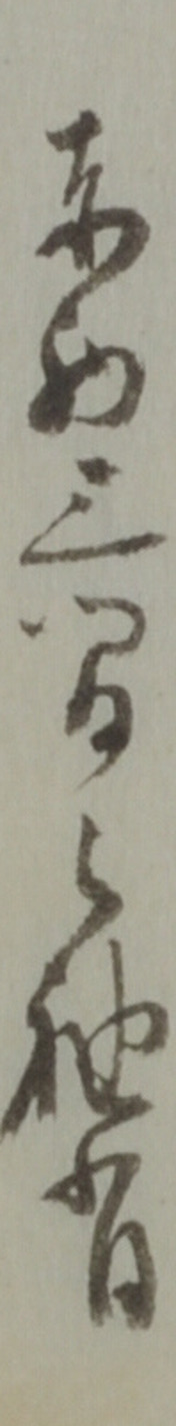東西三間之袖有
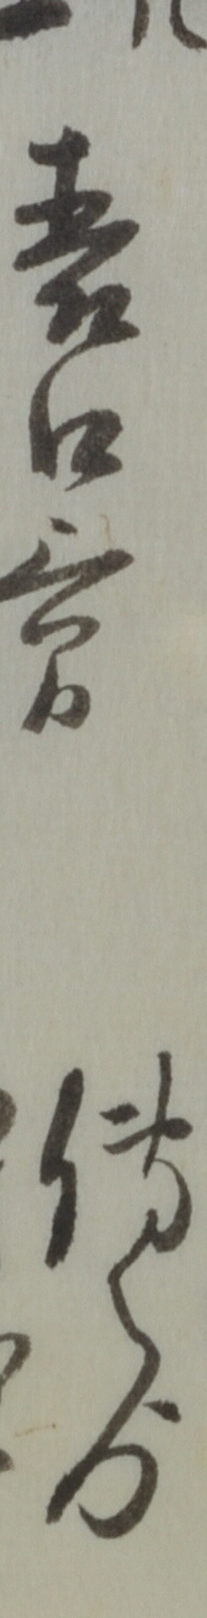一表口三間伝右衛門
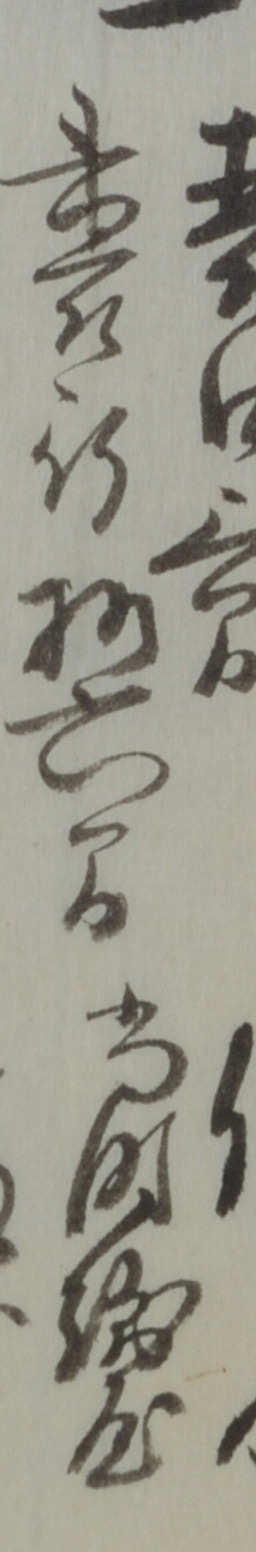裏行拾六間当時綿屋
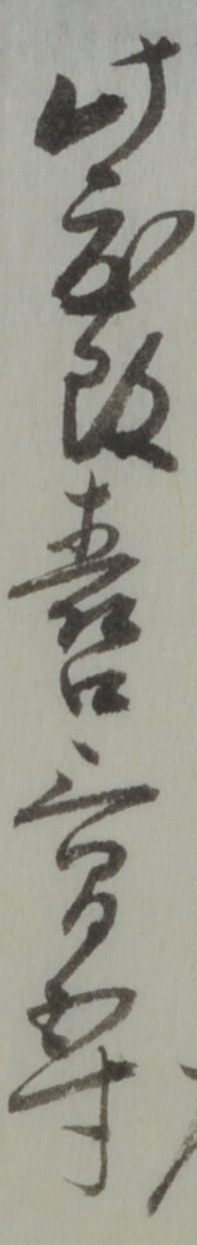此度改表口三間五寸
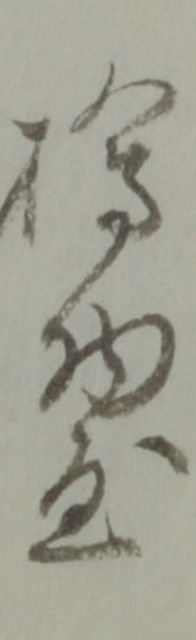檜物屋
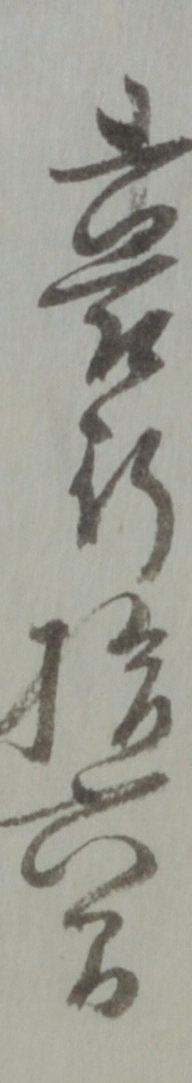裏行拾六間
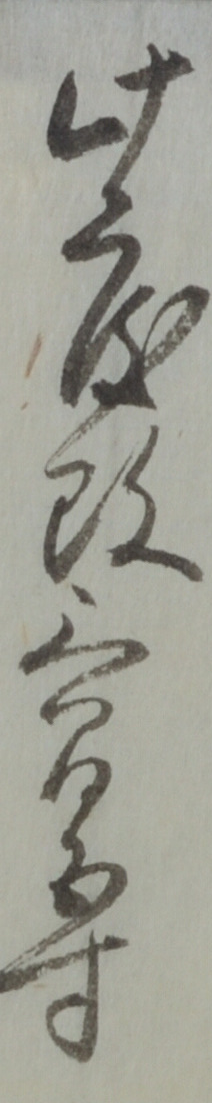此度改三間五寸

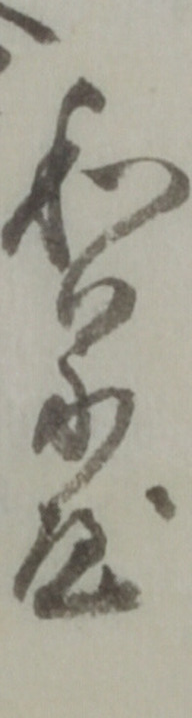和泉屋
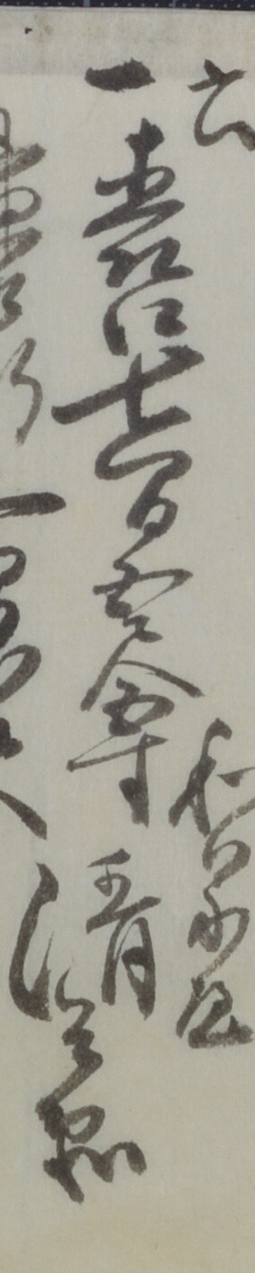一表口七間五尺五寸清兵衛
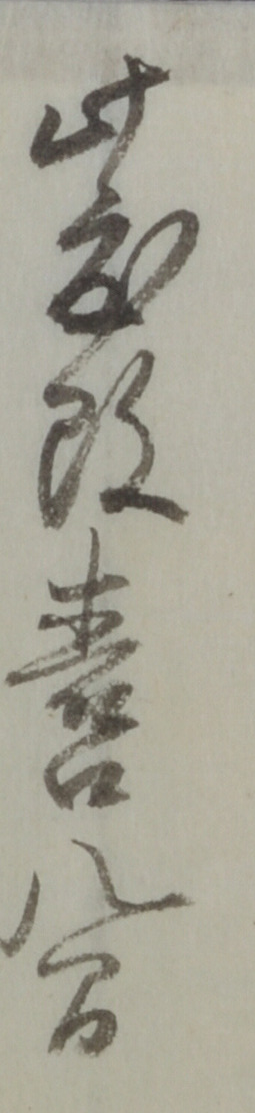此度改表口八間
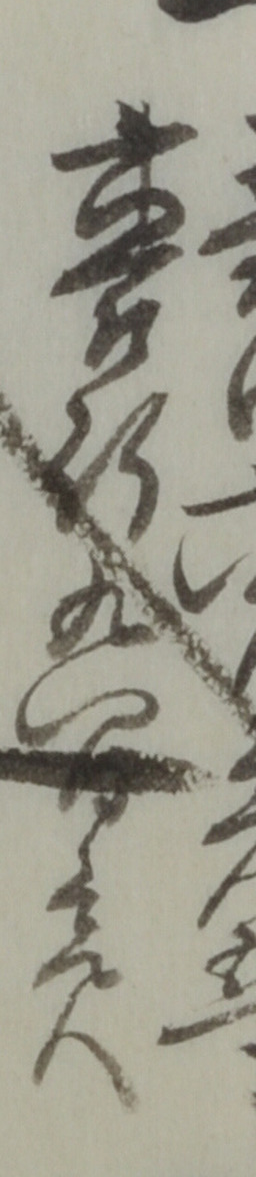裏行九間壱尺
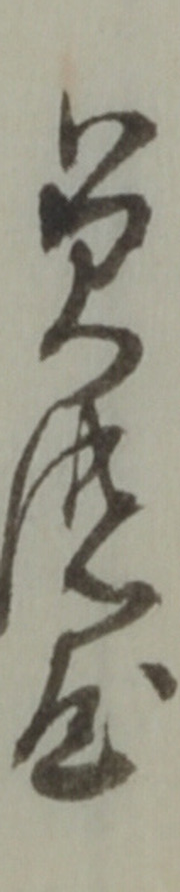美濃屋
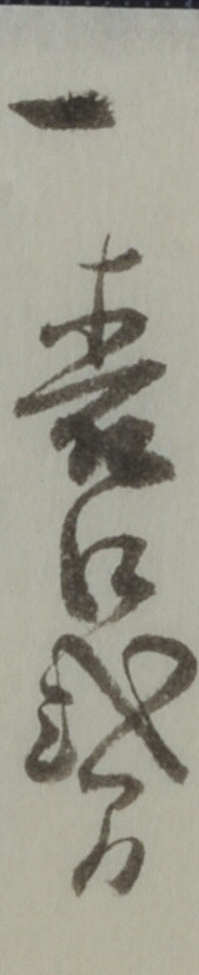一表口弐間
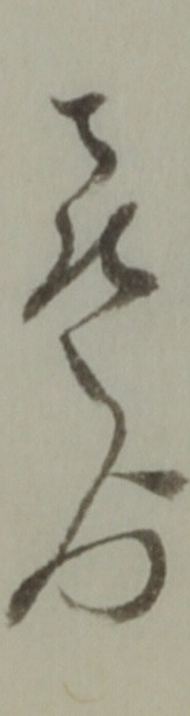喜右衛門
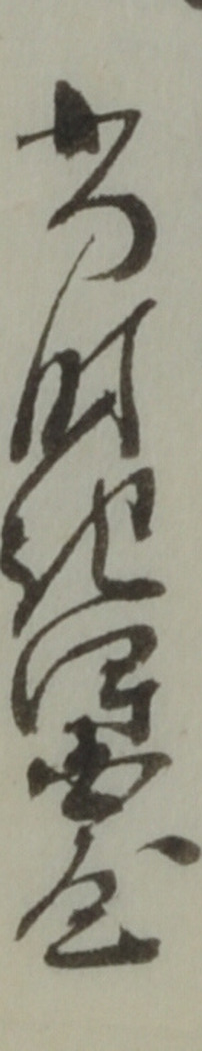当時紀伊国屋
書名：屋敷表口裏行書上
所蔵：伊那市立高遠町図書館・合同会社AMANE
